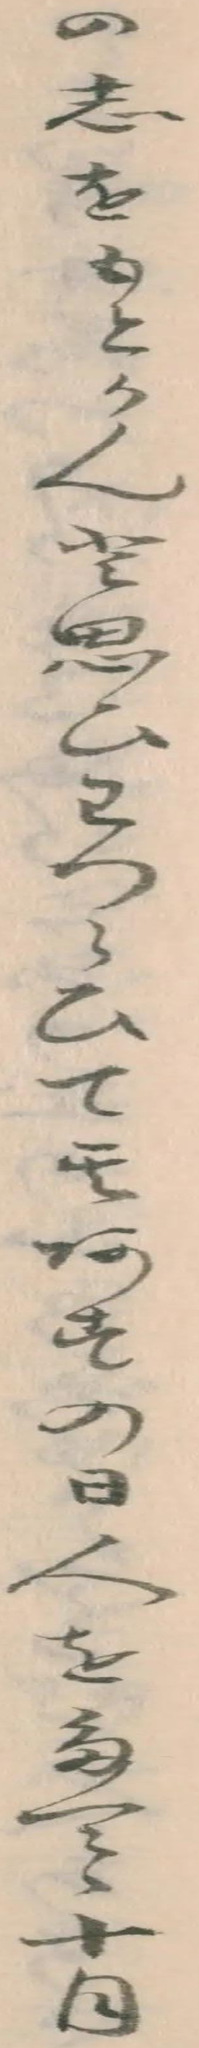の志をもとかんと思ひわつらひて其あすの日人をたてゝ十月
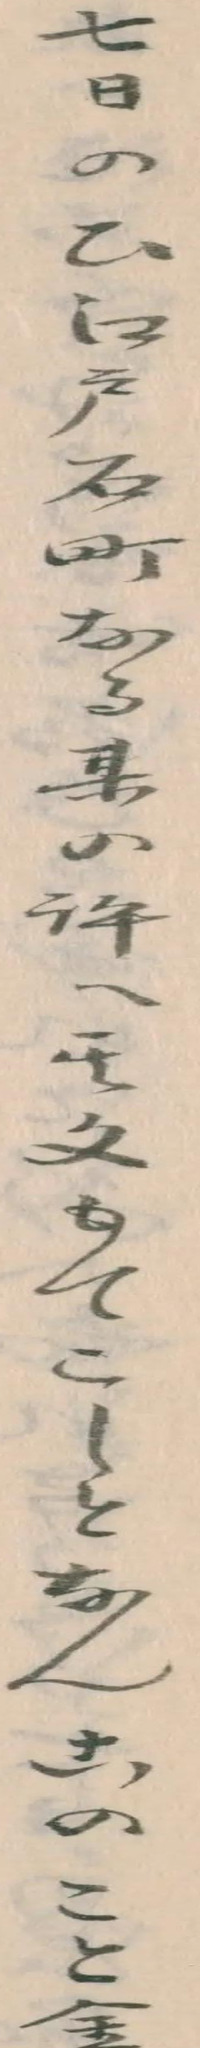七日のひ江戸石町なる某の許へ其文もてこしとなんこのこと金
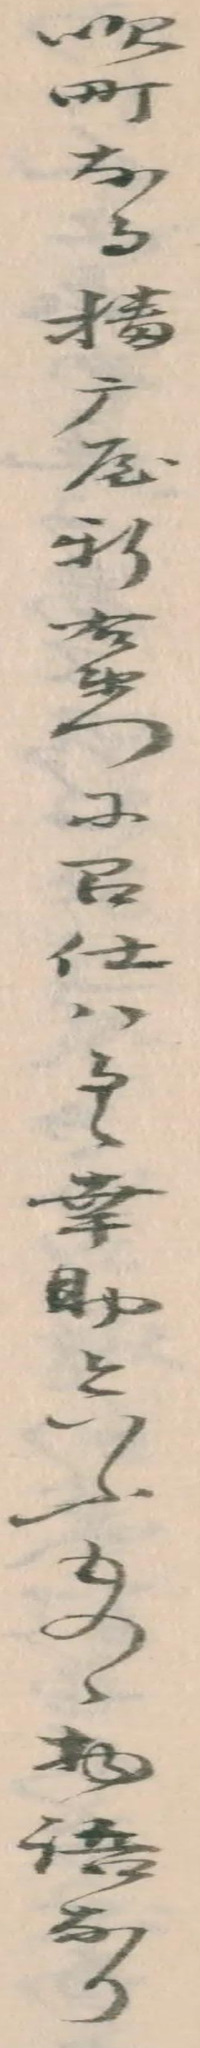吹町なる播磨屋新右衛門に召仕ハるゝ幸助といふものゝ物語なり
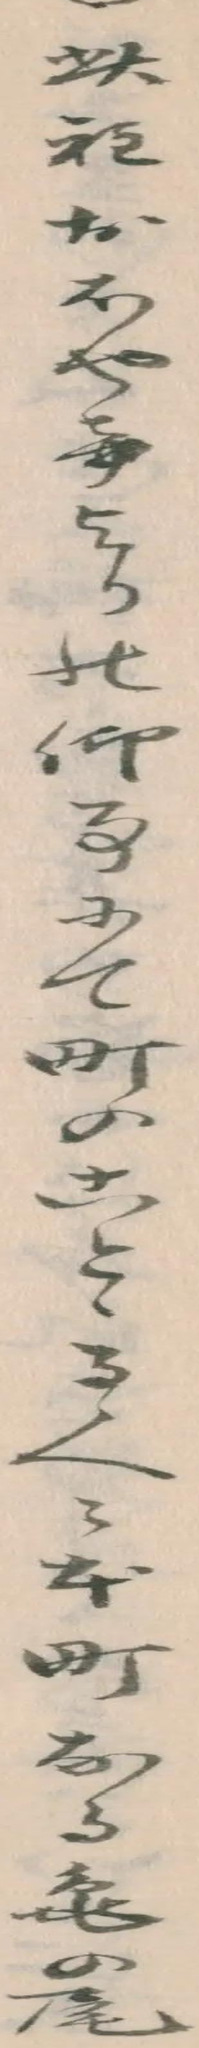○此程おほやけよりの仰事にて町のことゝる人々本町なる亀の尾
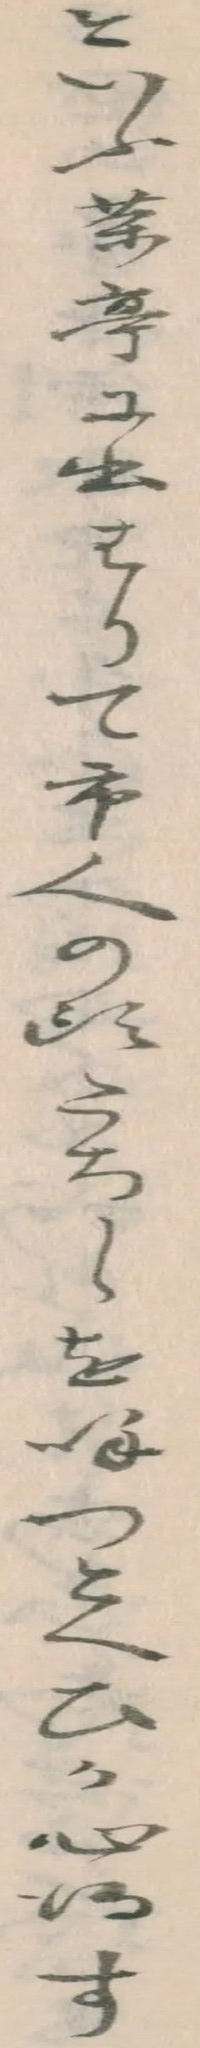といふ茶亭に出はりて市人の頭たちしを呼つとへひか心得す
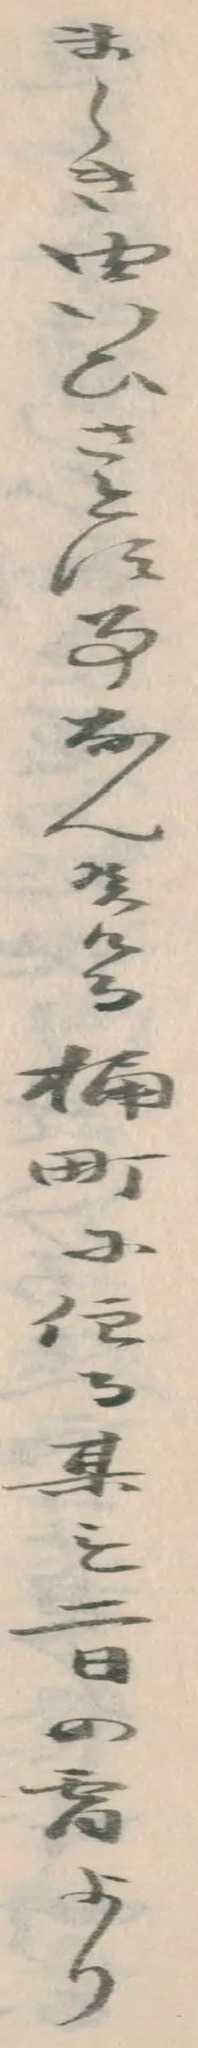ましき由いひさとす事なん候ける桶町に住る某も二日の宵より
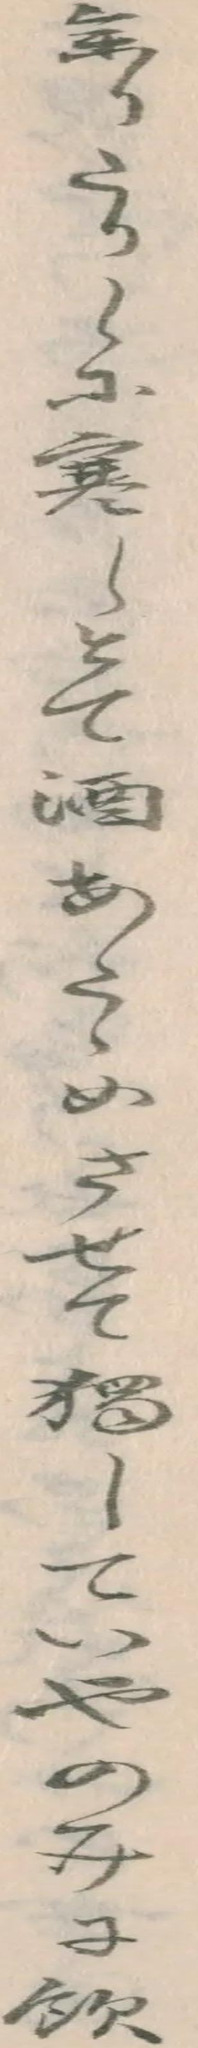参りたりしに寒しとて酒あたゝめさせて独していやのみに飲
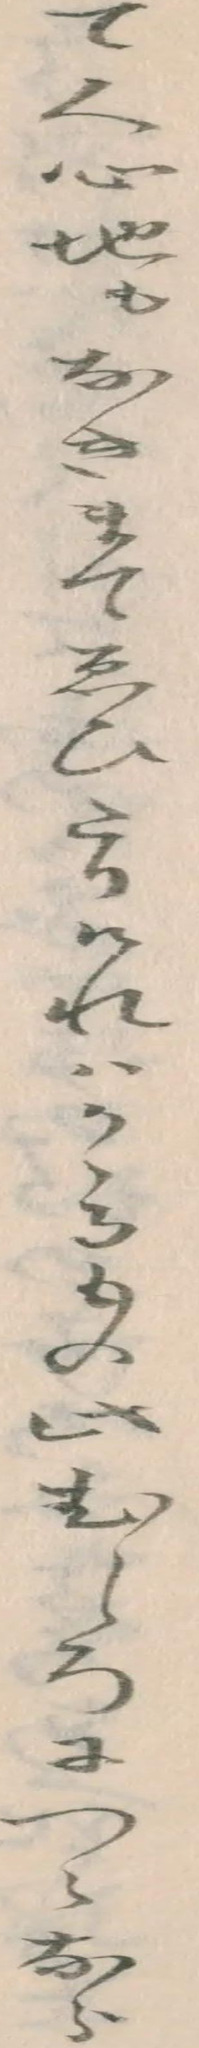て人心地もなきまてゑひたりけれはかゝるもの此むしろにつらなら
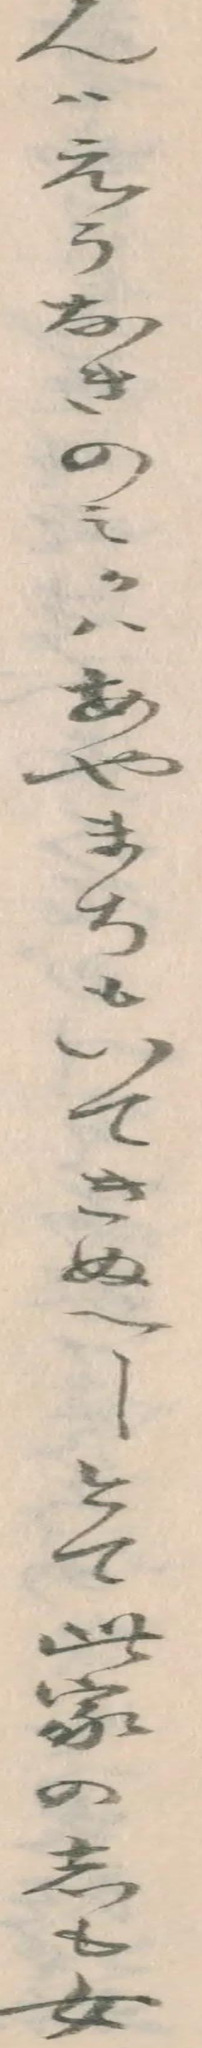んはえうなきのみかはあやまちもいてきぬへしとて此家の者も女
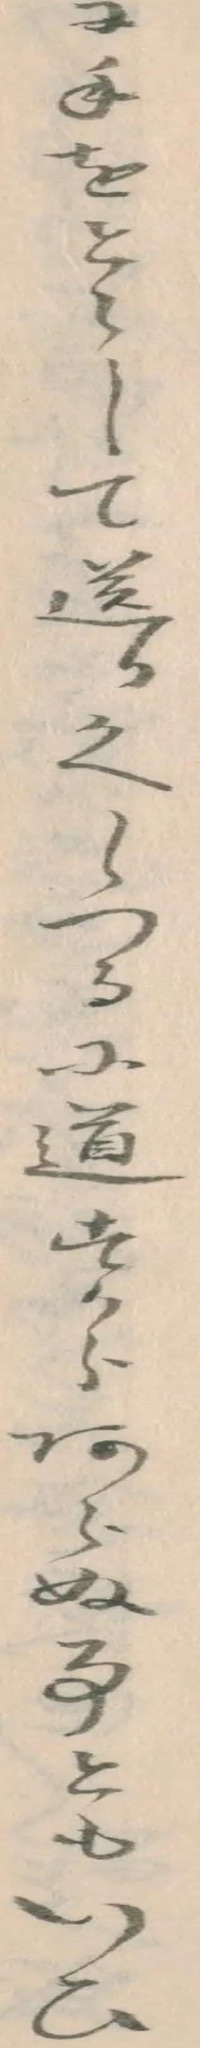に手をとらして送りかへしつるに道すからあらぬ事ともいひ

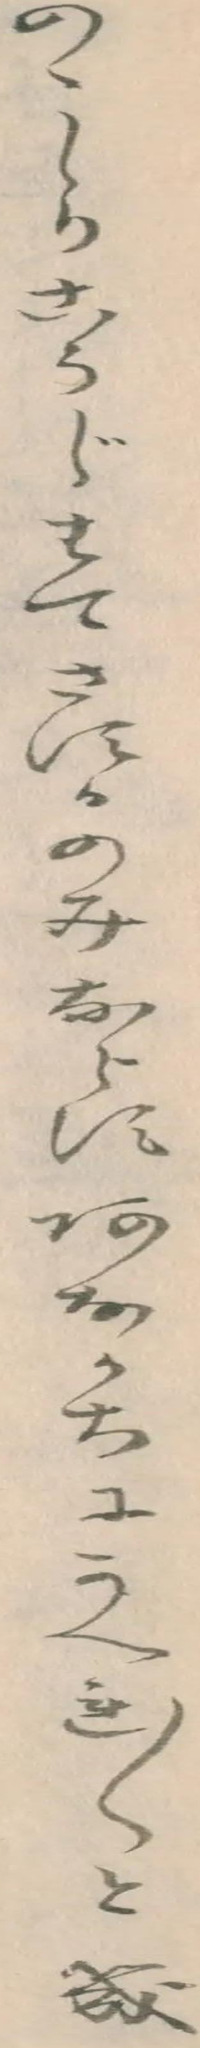のゝしりこうじはてさすかのみならすあなかちにかへれ〳〵と幾
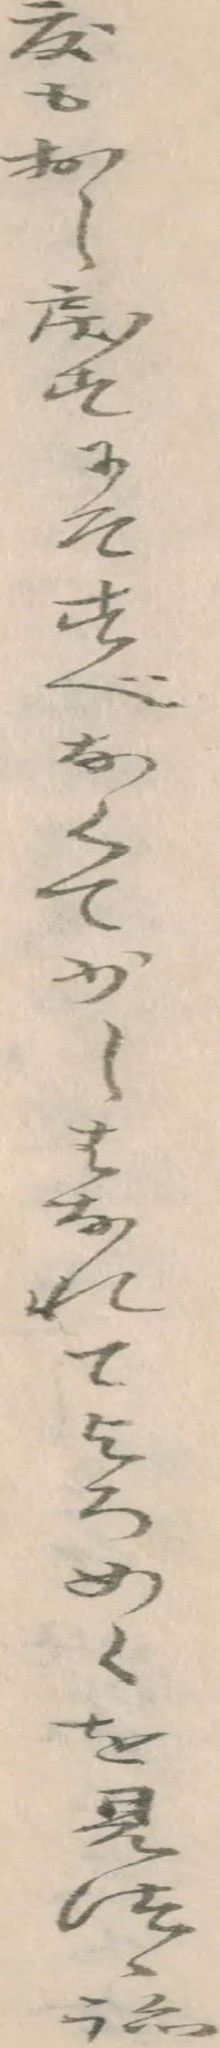度もおし戻すにそすべなくて少しはなれてよろめくを見つつ跡
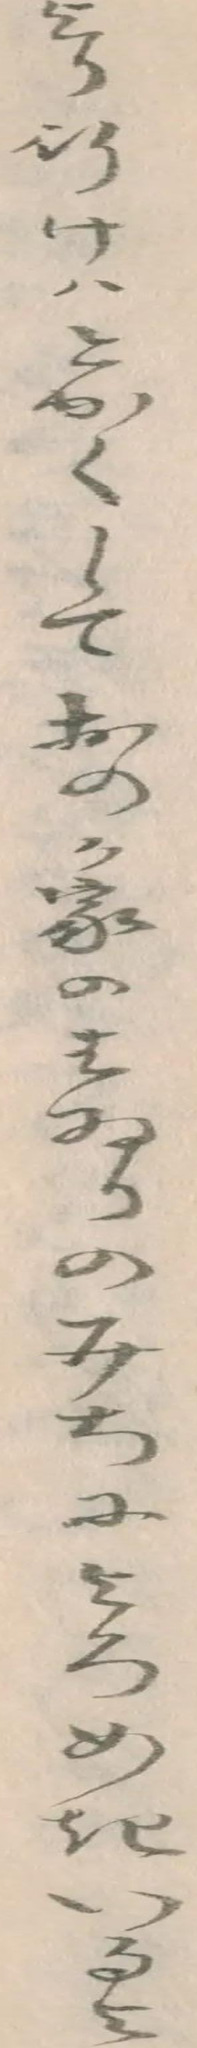より行けはとかくしておのか家のはゐりのみちによろめきいるよ
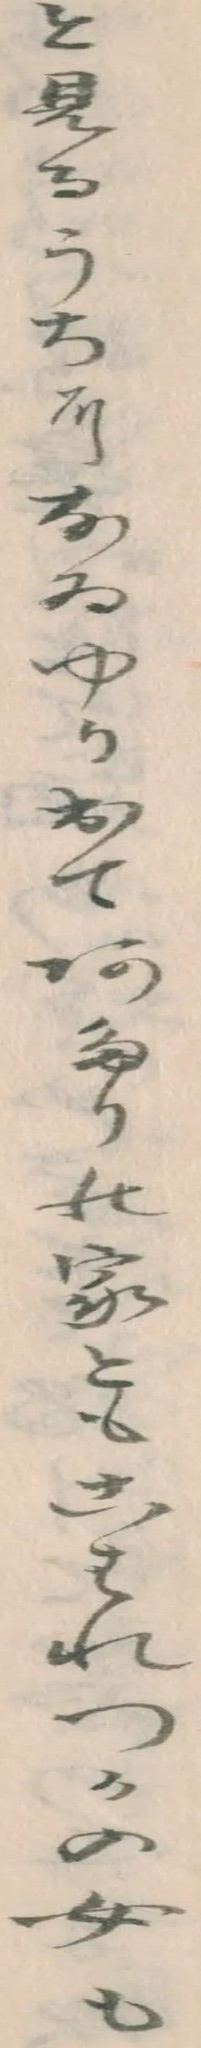とみるうちになゐゆり出てあたりの家ともこすれつかの女も
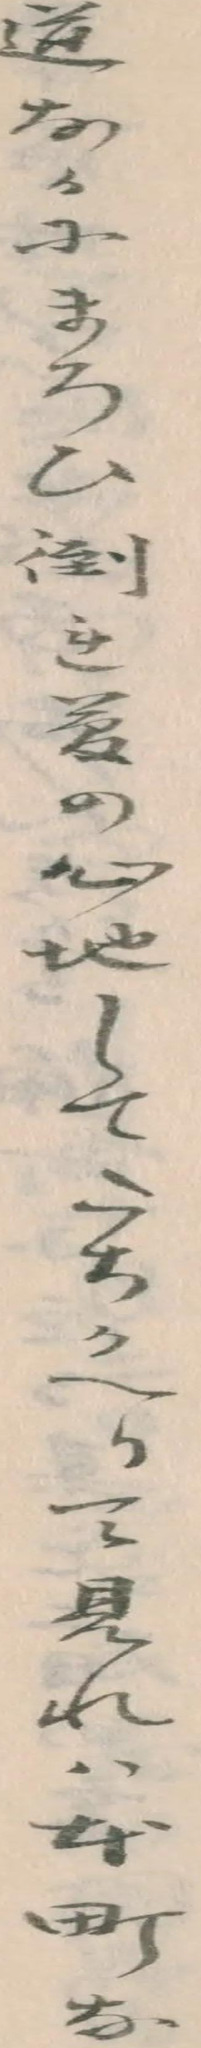道なかにまろひ倒れ夢の心地してたちかへりて見れは本町な
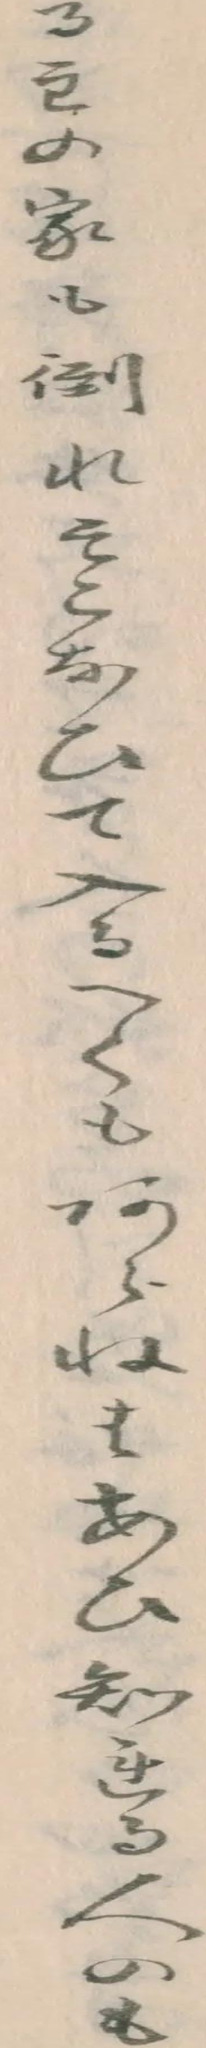る主の家も倒れそこなひて入るへくもあらねはあひ知れる人のも
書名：地災撮要. 巻10(地震之部) 上,下
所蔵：国立国会図書館 National Diet Library, JAPAN
